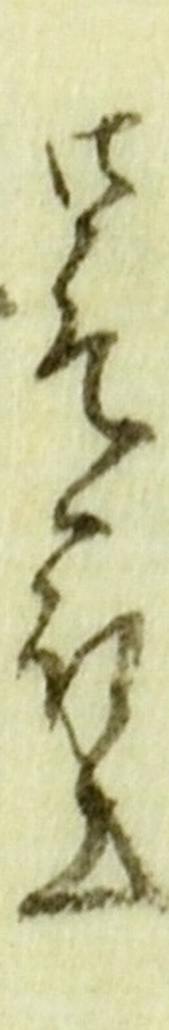御座候以上
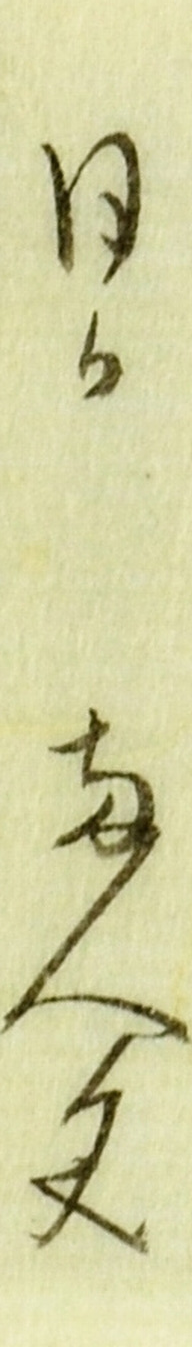月日両人名
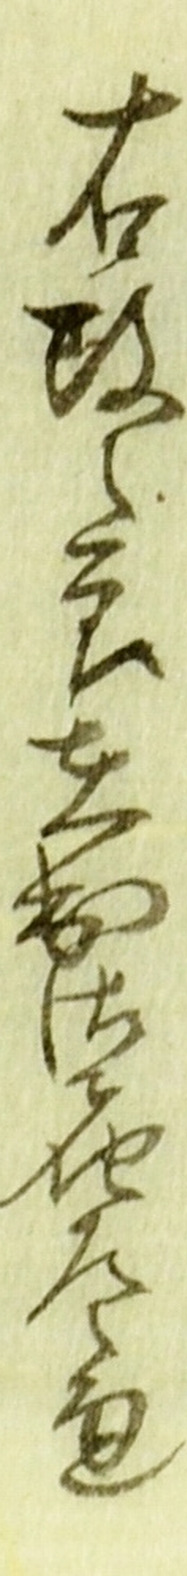右改之節者出御届左之通
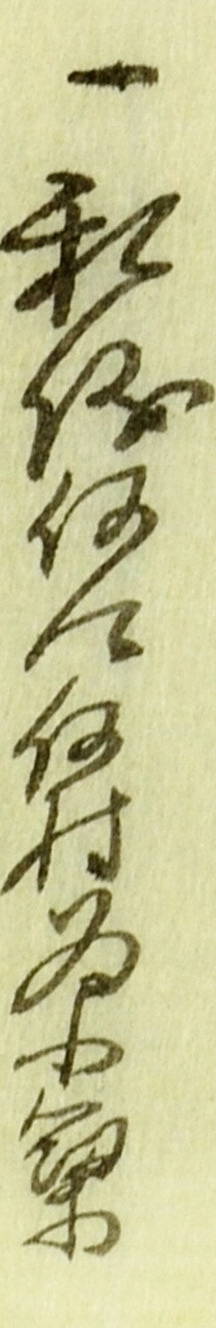一私儀何郷何村為小簗
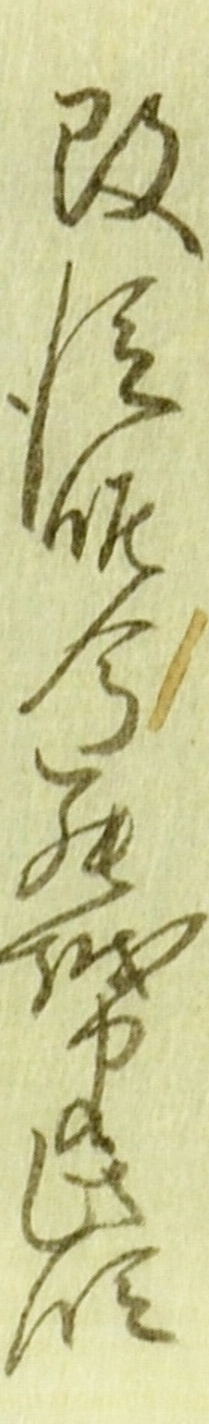改後昨今罷越申入此段
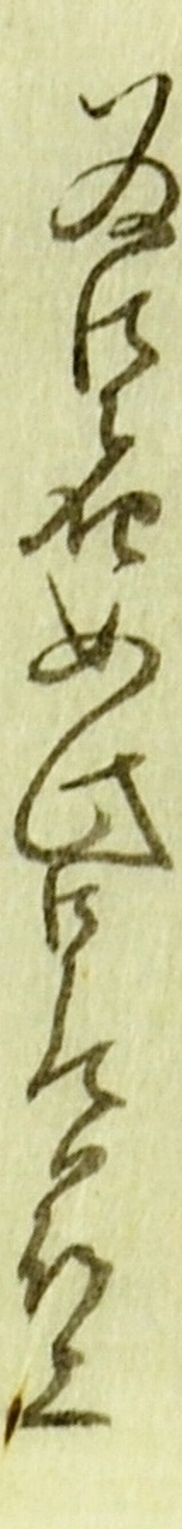為御届如此御座候以上
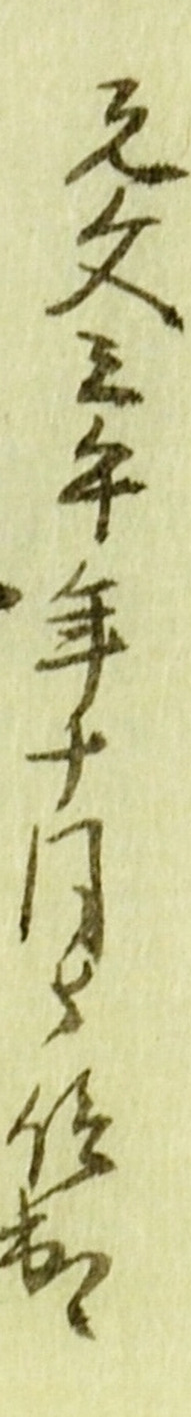元文三午年十月日仰出候
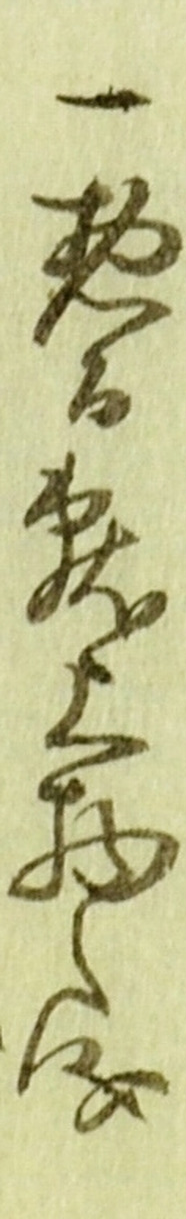一惣而献上物之儀
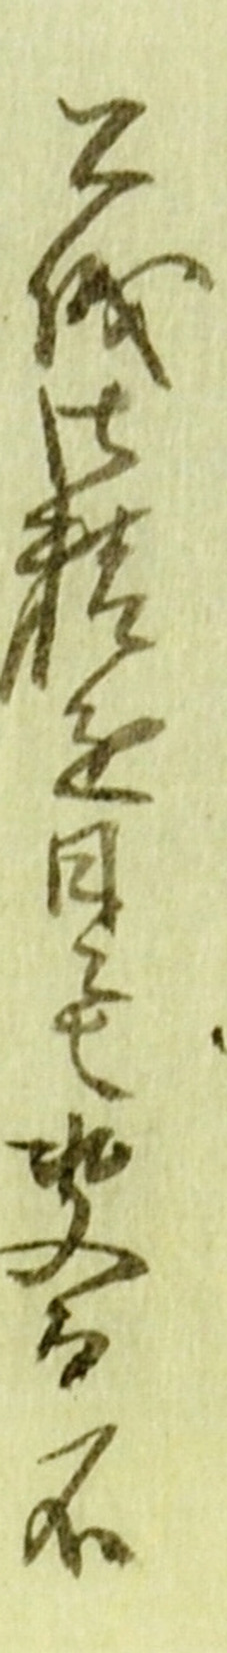公儀御精進日々者決而不
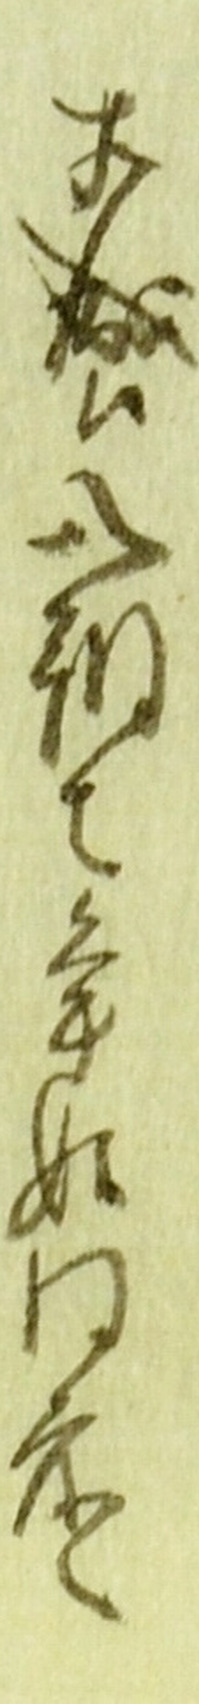相成候八朔者年如同前之
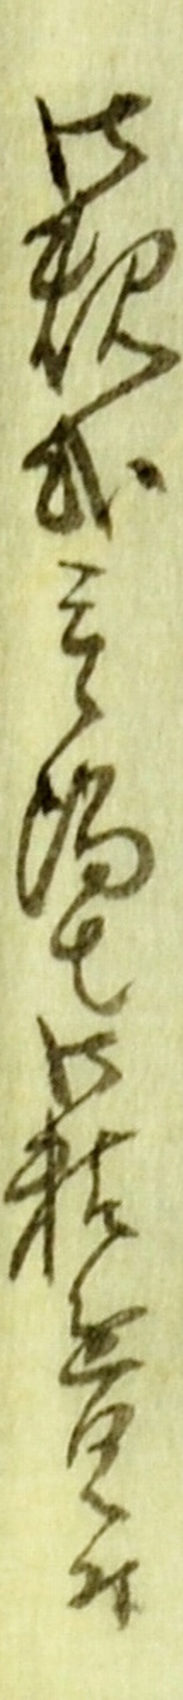御規式ミ候得者御精日ニ付

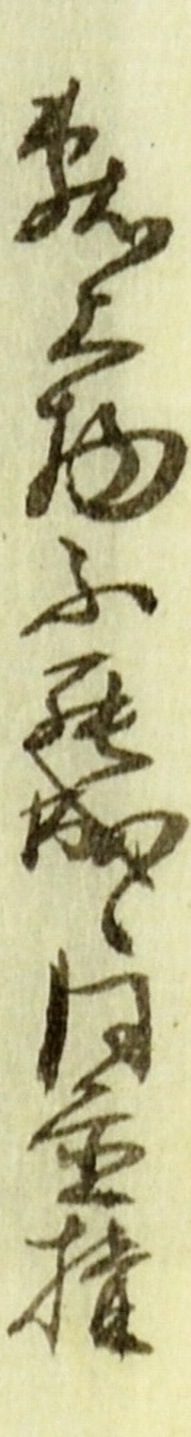献上物不罷成候同置構
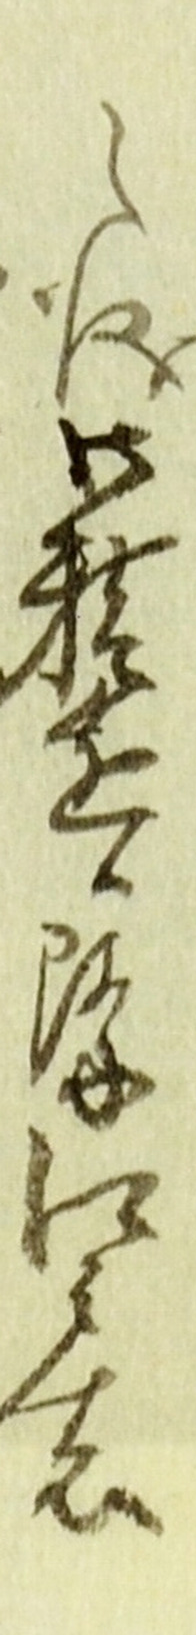之儀御精進候降江戸者
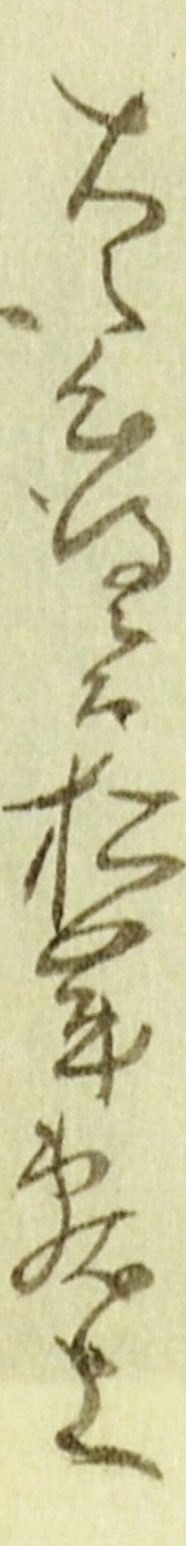右之心得ニ而松歳献上
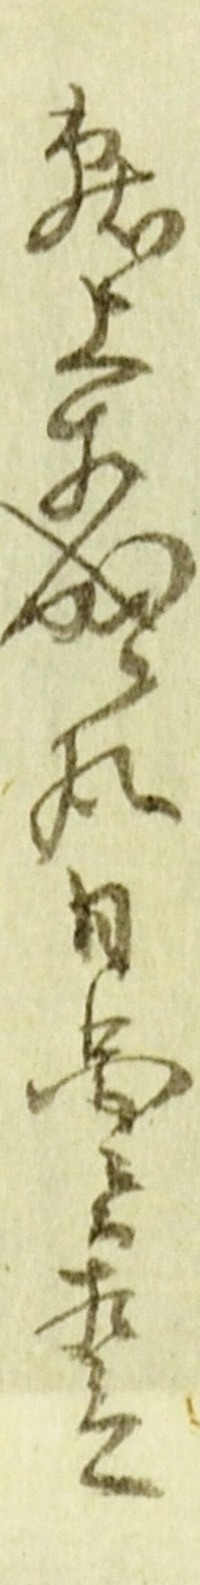献上相成候様日図ニ而相立
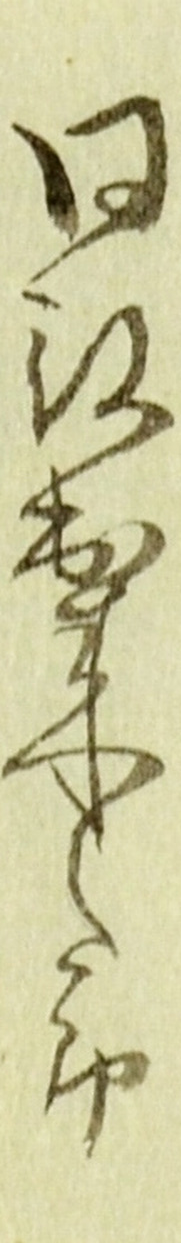同役出来之節
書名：分一御定法
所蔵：伊那市立高遠町図書館・合同会社AMANE
